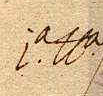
1.a tta.
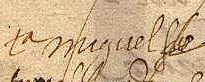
ta miguel de
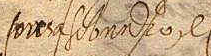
sousa sobrinho, e
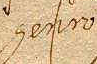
genro
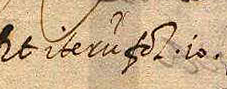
Et iterū fol. i0.
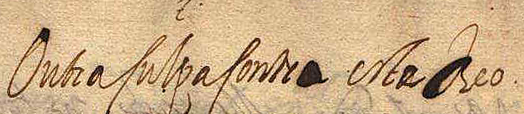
Outra Culpa Contra este Reo.
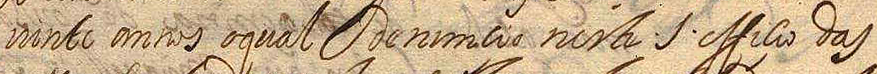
uinte annos o qual denuncio neste .s. officio das
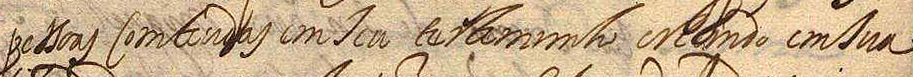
pessoas Comteudas em seu testemunho estando em sua
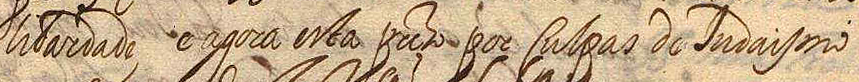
libardade, e agora esta prezo por Culpas de Iudaismo
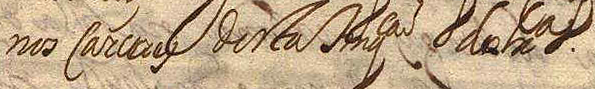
nos Carceres desta Imqcaõ de lxa
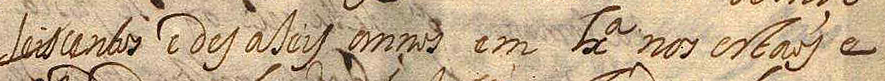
seiscentos e desaseis annos em Lxa nos estaos e
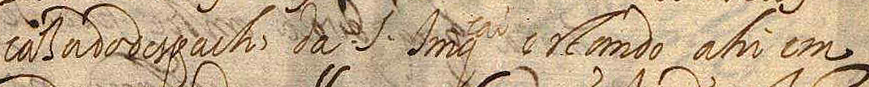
caza do despacho da S. Imqcão estando ahi em
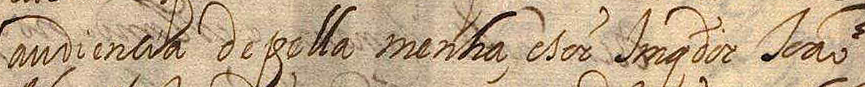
audiençia de pella menha o sor̄ Imq̄dor Ioaõ
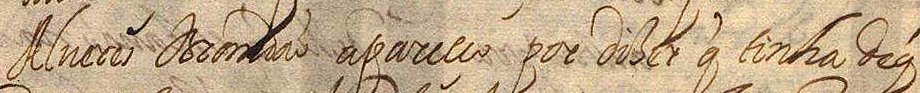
Alueres Brandão apareçeo por dizer q̄ tinha de q̄
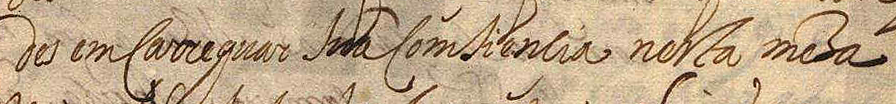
desemCarreguar sua ComSiençia nesta meza
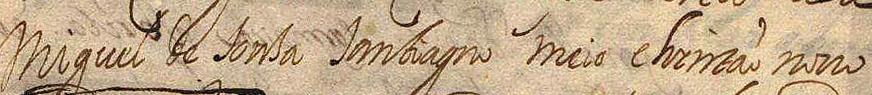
Miguel de sousa Santiaguo meio christão nouo
